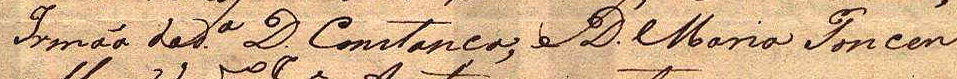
Irmaã da d.a D. Constança, e D. Maria Toncen
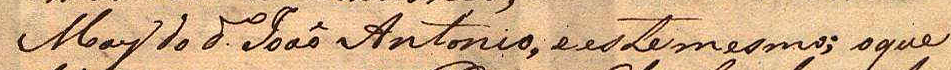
May do d.o Ioaõ Antonio, e este mesmo; o que
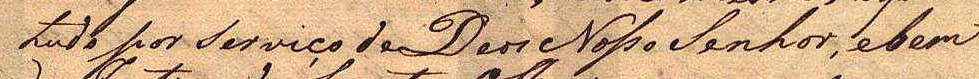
tudo por serviço de Deos Nosso Senhor, e bem
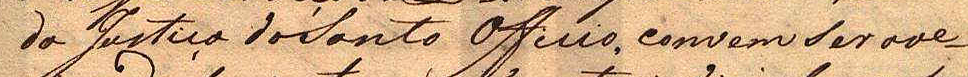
da Justiça do Santo Officio, convem ser ave
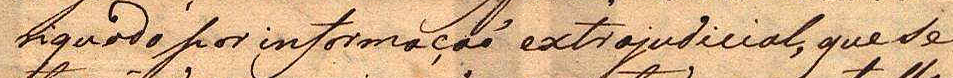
riguado por informaçaõ extrajudicial, que se
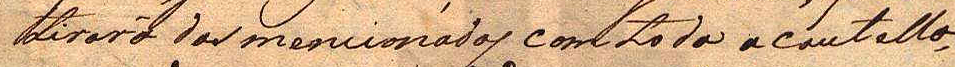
tirará das mencionadas com toda a cautella,
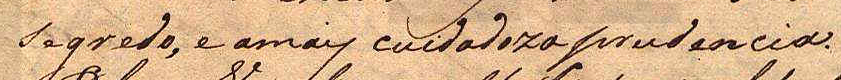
segredo, e a mais cuidadoza prudencia.
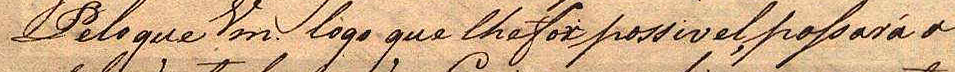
Pelo que Vm. logo que lhe foi possivel, passará a
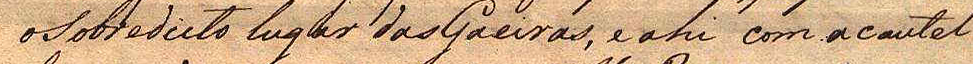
o sobredicto lugar das Gaeiras, e ahi com a cautel
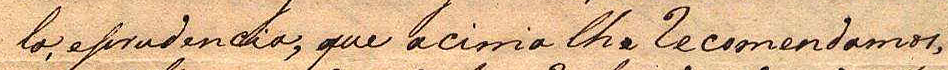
la, e prudencia, que acima lhe Recomendamos,
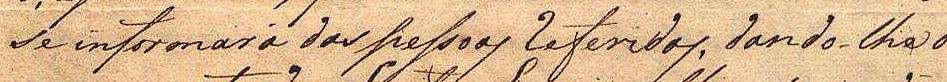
se informará das pessoas Referidas, dando-lhe o
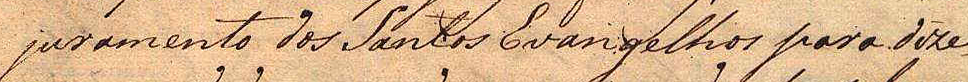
juramento dos Santos Evangelhos para dize
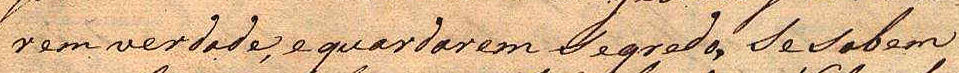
rem verdade, e guardarem segredo, se sabem
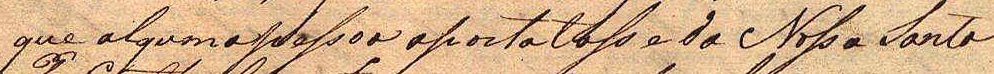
que alguma pessoa apostatasse da Nossa Santa
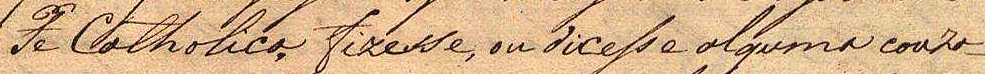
Fe Catholica, fizesse, ou dicesse alguma couza
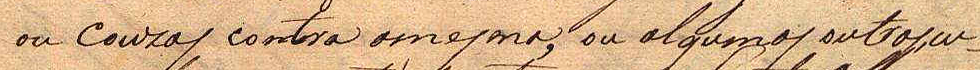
ou couzas contra a mesma, ou algumas outras, cu
